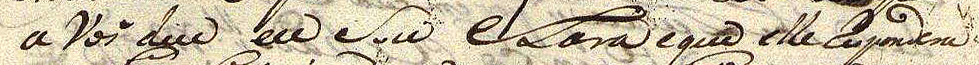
a Vós dice eu Sou CLara e que elle Respondera
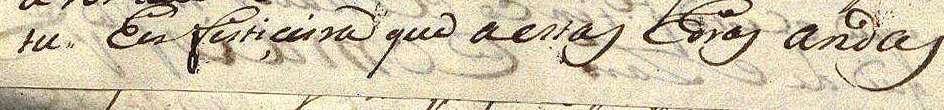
tu Ees feiticeira que a estas horas andas
